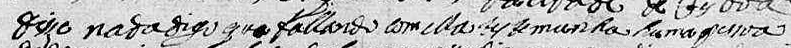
disse nada digo que fallando com ella testemunha huma pessoa
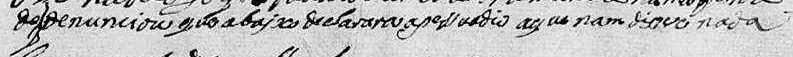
do q̄ denunciou que abajxo declarara a pessuadio a que nam dissese nada
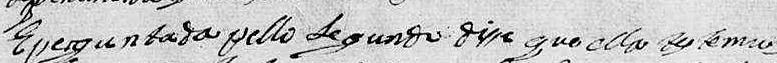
E perguntada pello segundo disse que ella testemu
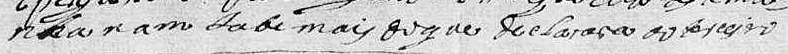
nha nam sabe mais do que declarara ao terceiro
